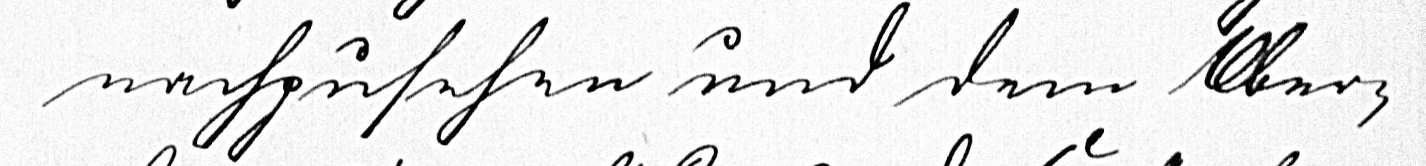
nachpuschen und dem Ober¬
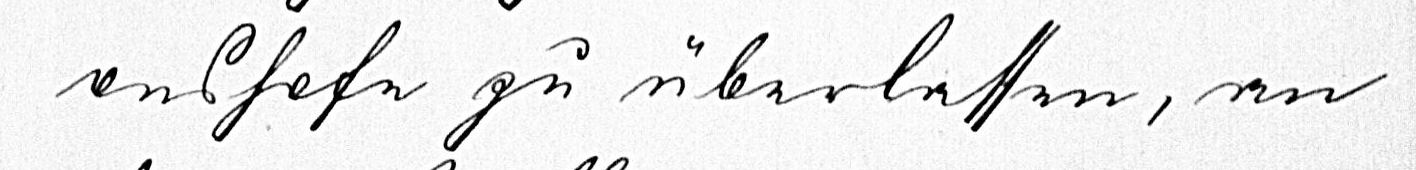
onshofe zu überlassen, an
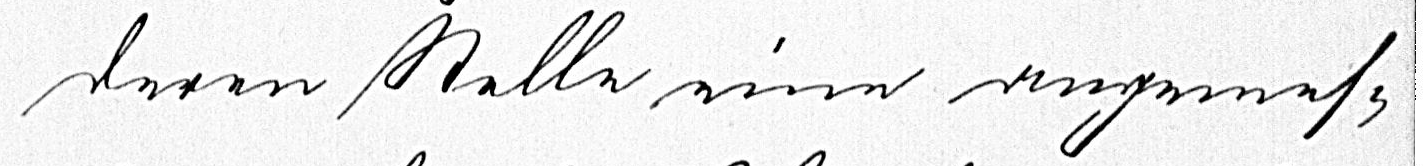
deren Stelle eine angemes¬
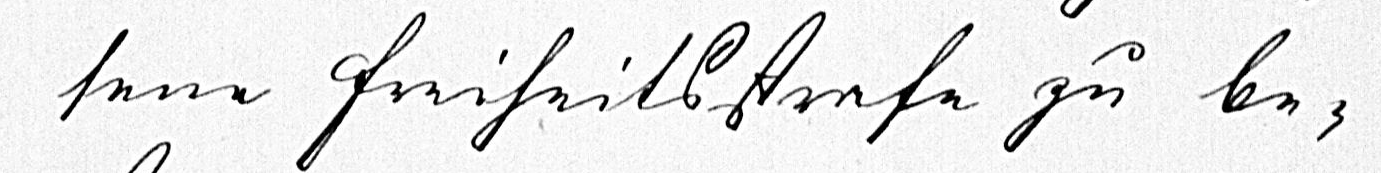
sene Freiheitsstrafe zu be¬
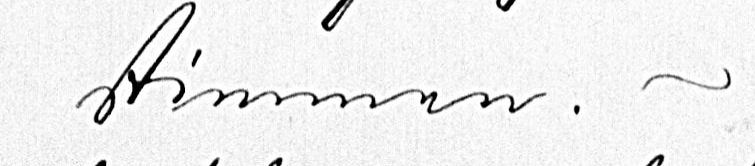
stimmen.
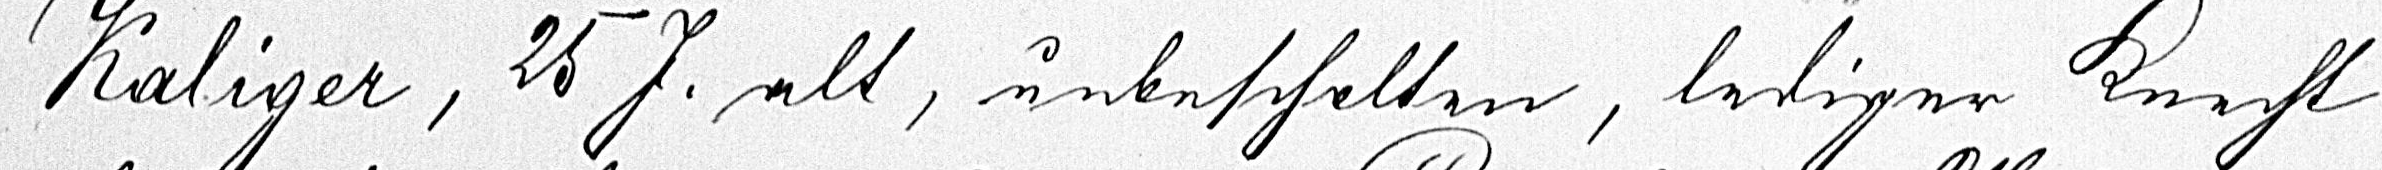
Kaliger, 25 J. alt, unbescholten, lediger Knecht
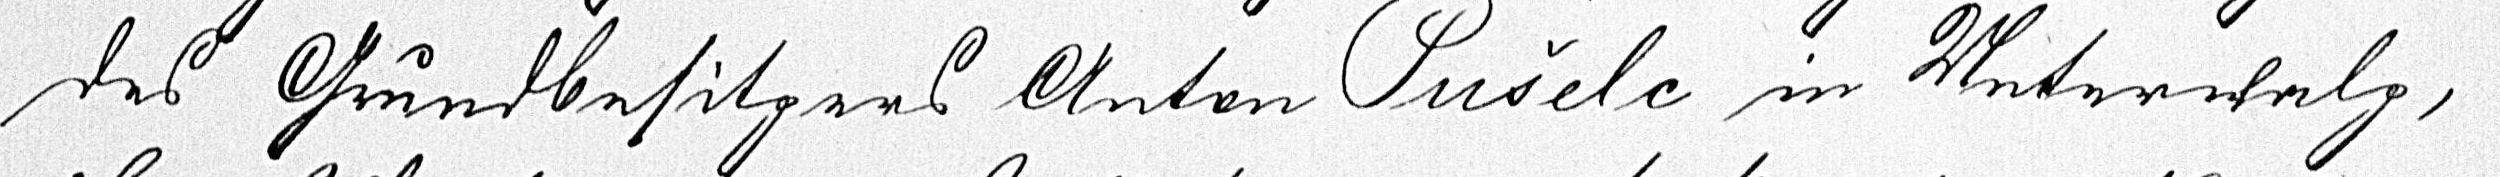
des Grundbesitzers Anton Pušelc in Unterwalz,
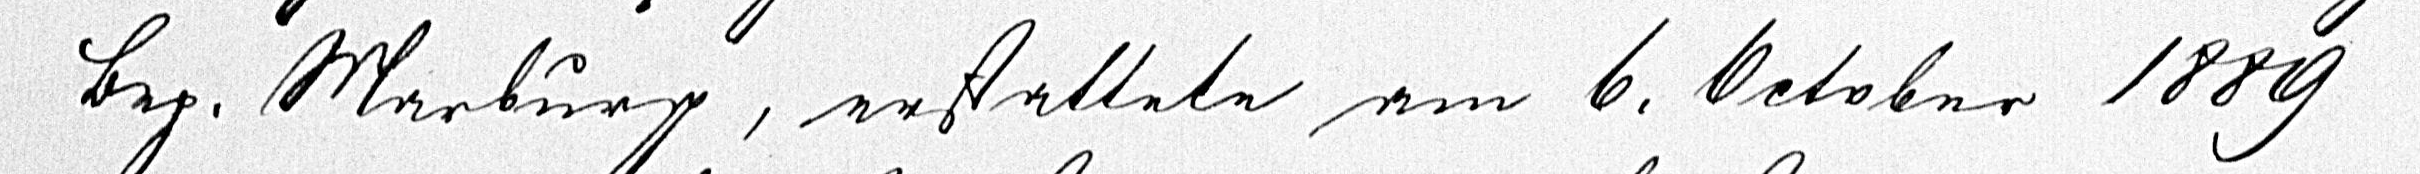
bez. Marburg, erstattete am 6. October 1889
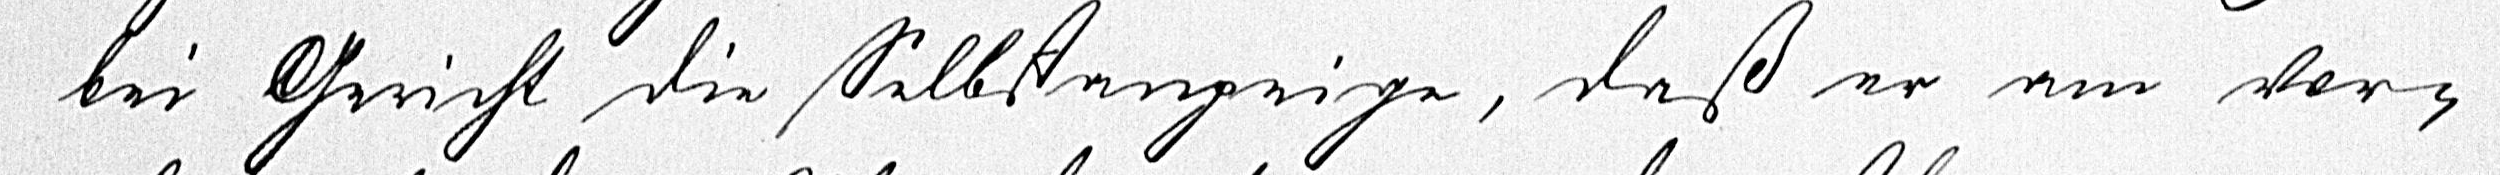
bei Gericht die Selbstanzeige, daß er am vor¬
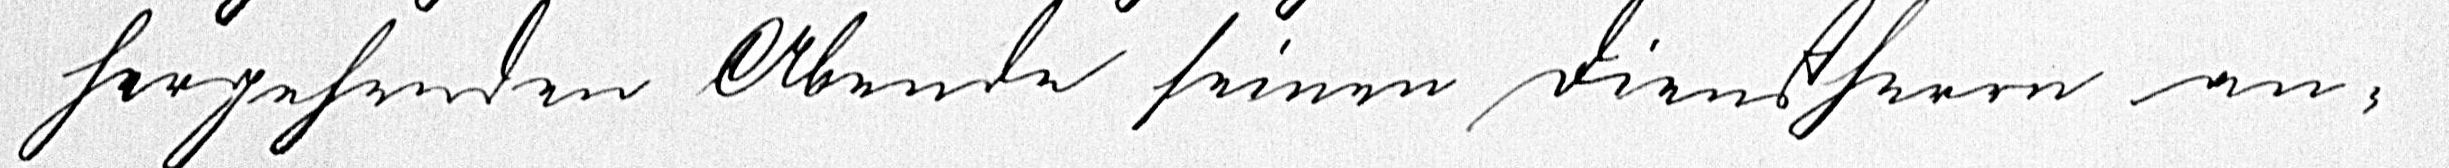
hergehenden Abende seinen Dienstherrn an¬
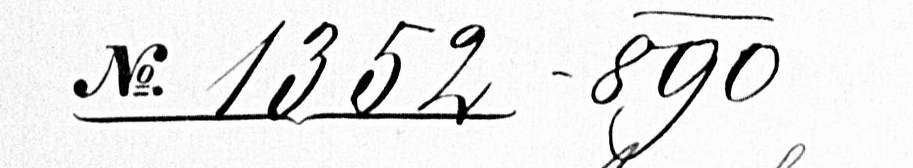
N° 1352 - 890
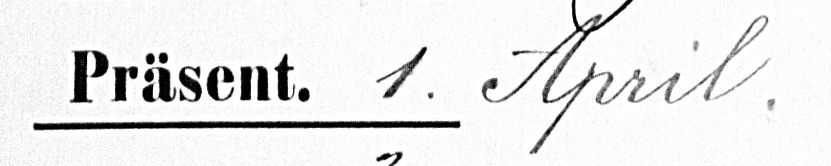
Präsent. 1. April.
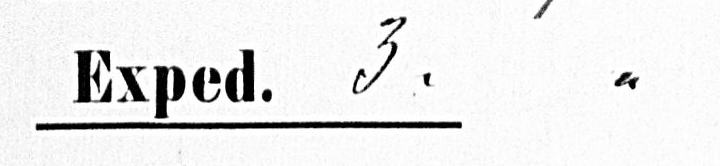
Exped. 3. April.
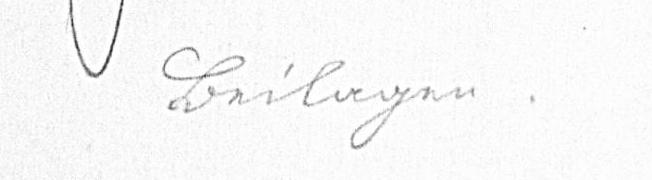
Beilagen.
